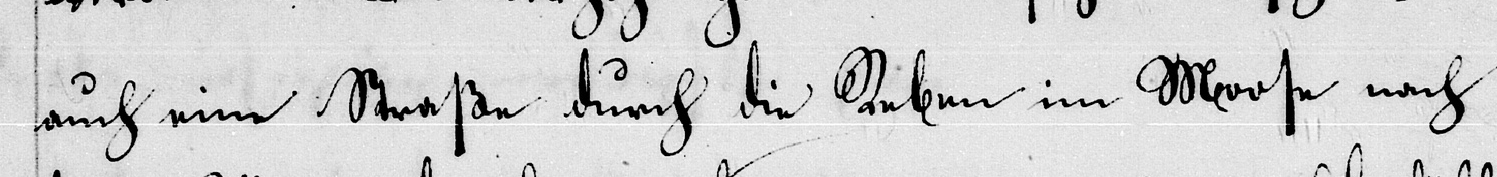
auch eine Straße durch die Reben im Moose nach
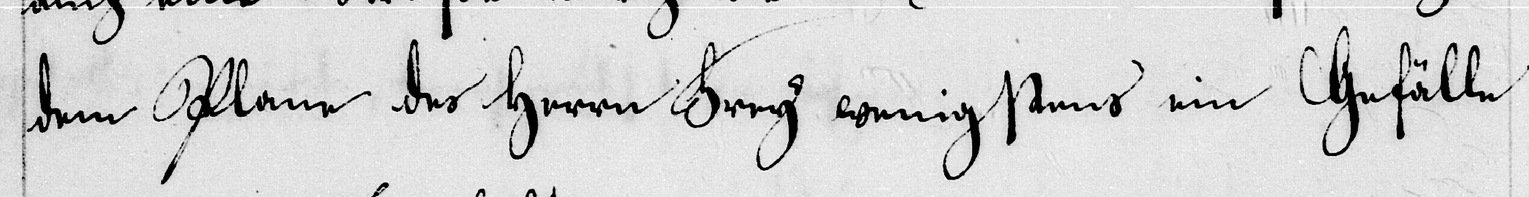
dem Plane des Herrn Frey wenigstens ein Gefälle
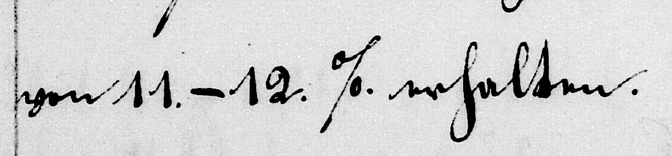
von 11.–12. % erhalten.
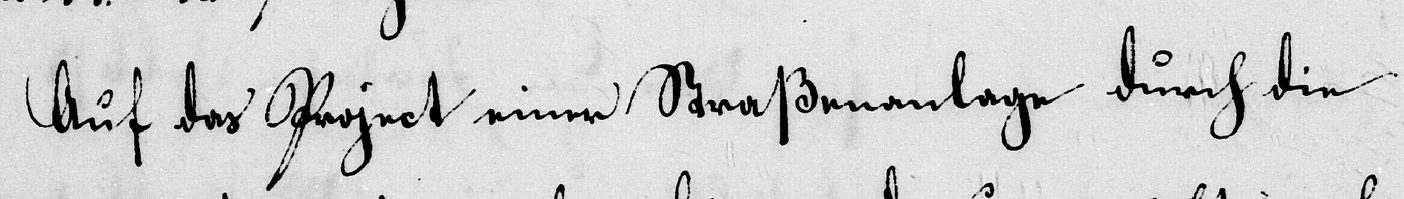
Auf das Project einer Straßenanlage durch die
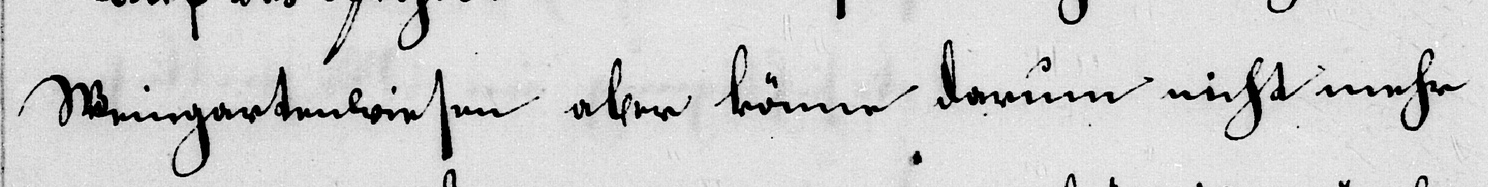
Weingartenwiesen aber könne darum nicht mehr
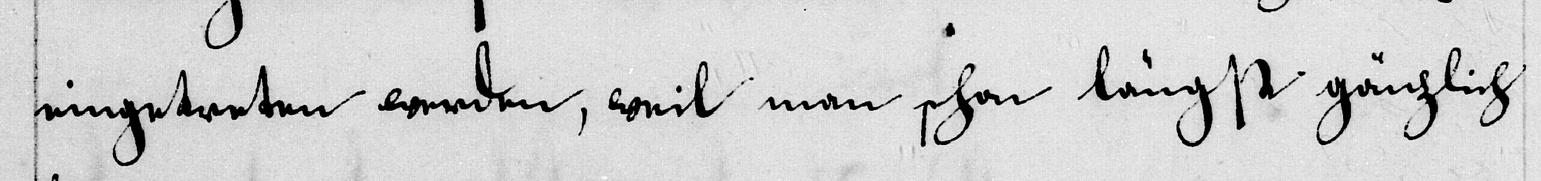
eingetreten werden, weil man schon längst gänzlich
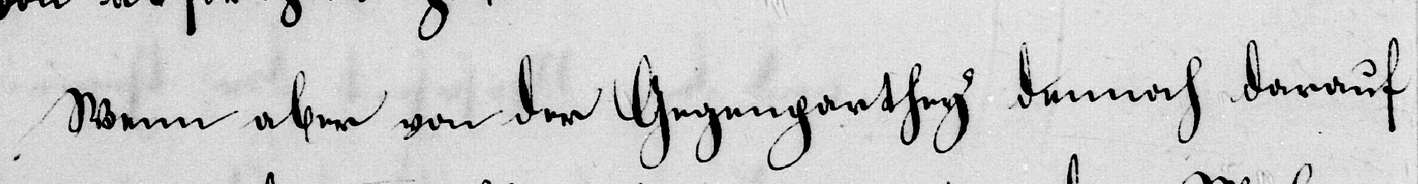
Wenn aber von der Gegenparthey dennoch darauf
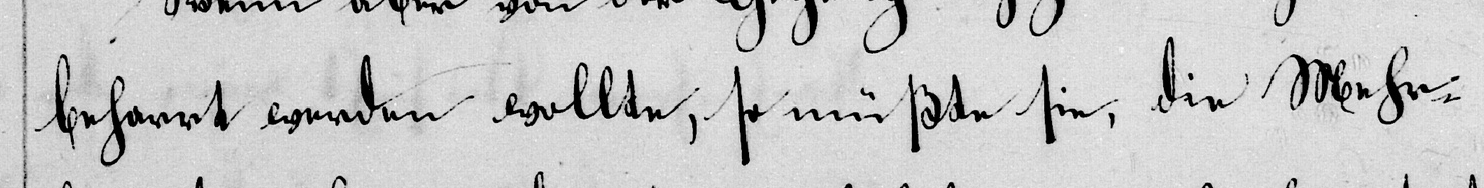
beharrt werden wollte, so müßte sie, die Mehr¬
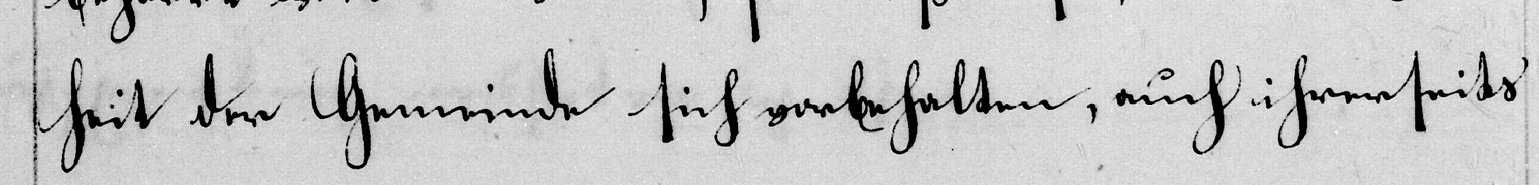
heit der Gemeinde sich vorbehalten, auch ihrerseits
